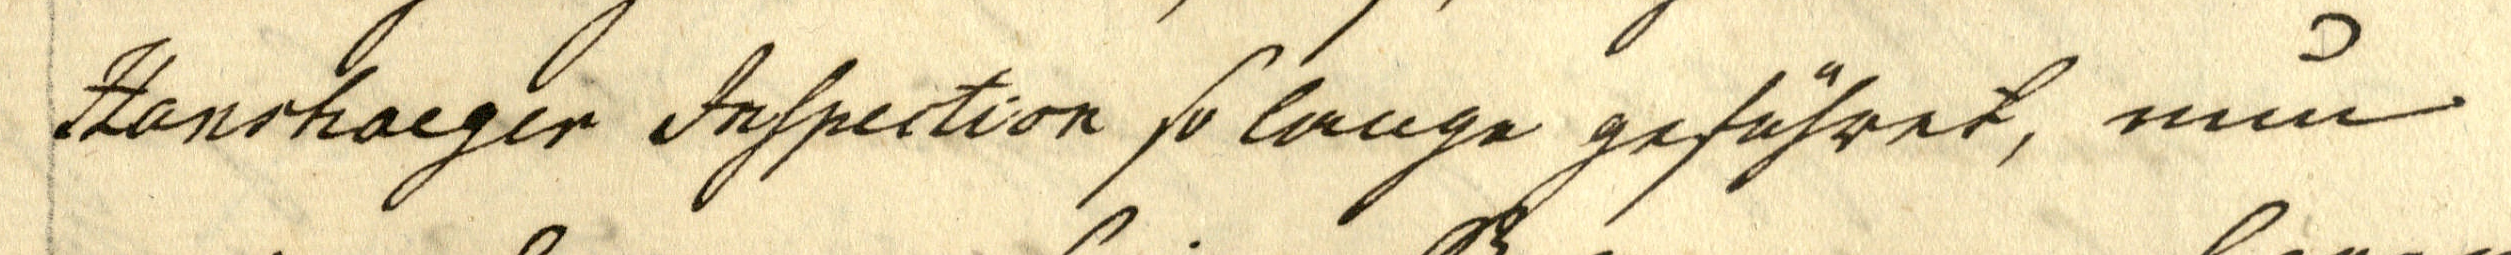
Hanshaeger Inspection so lange geführet, nun
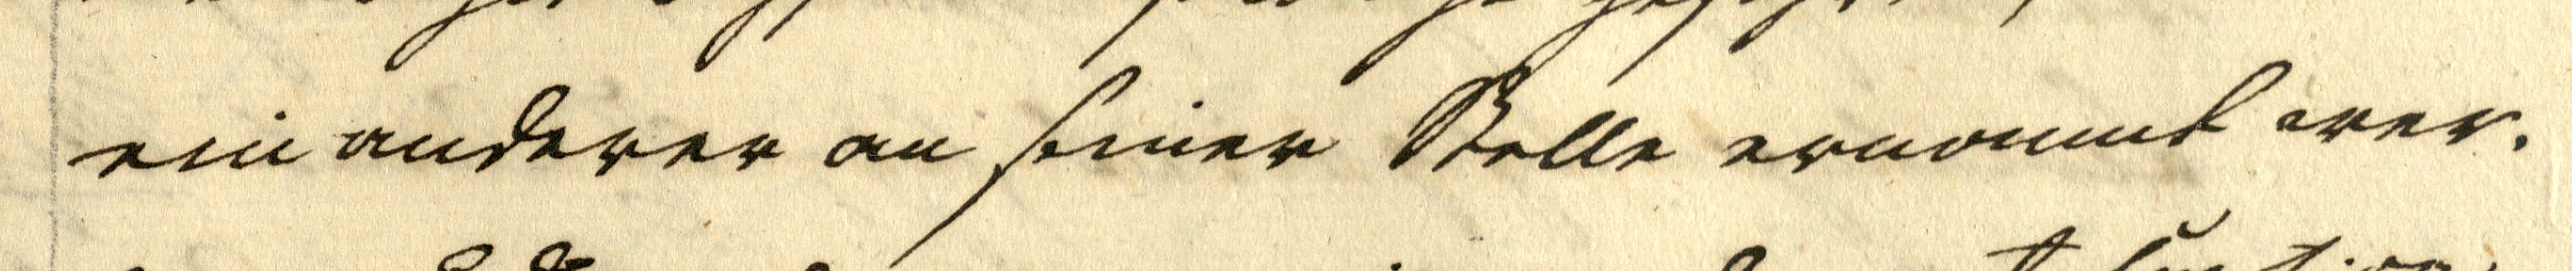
ein anderer an seiner Stelle ernannt wer-
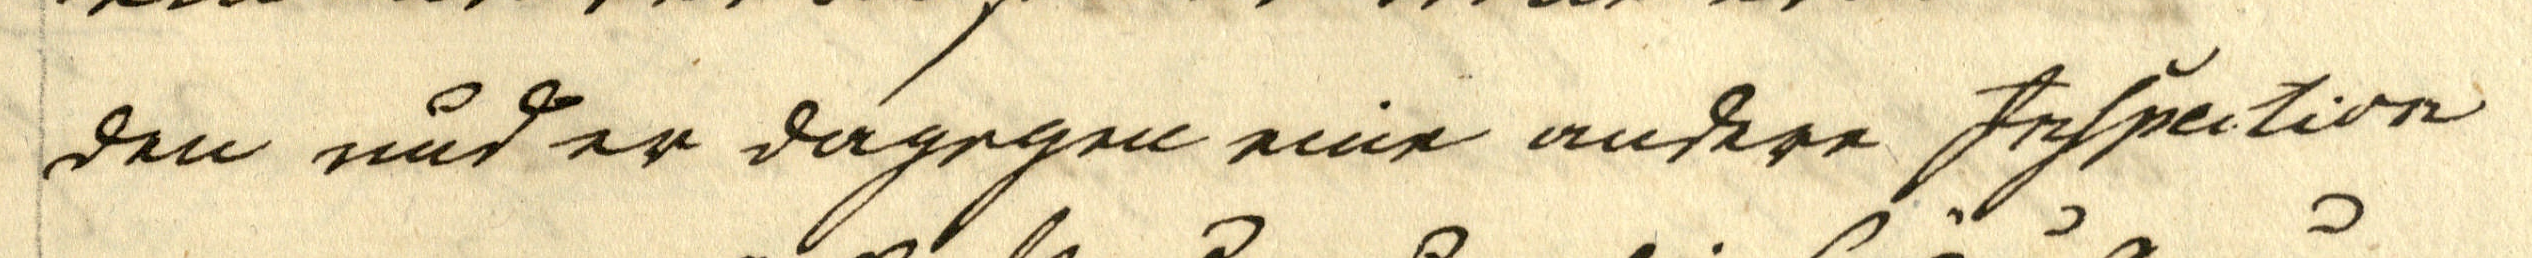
den und er dagegen eine andere Inspection
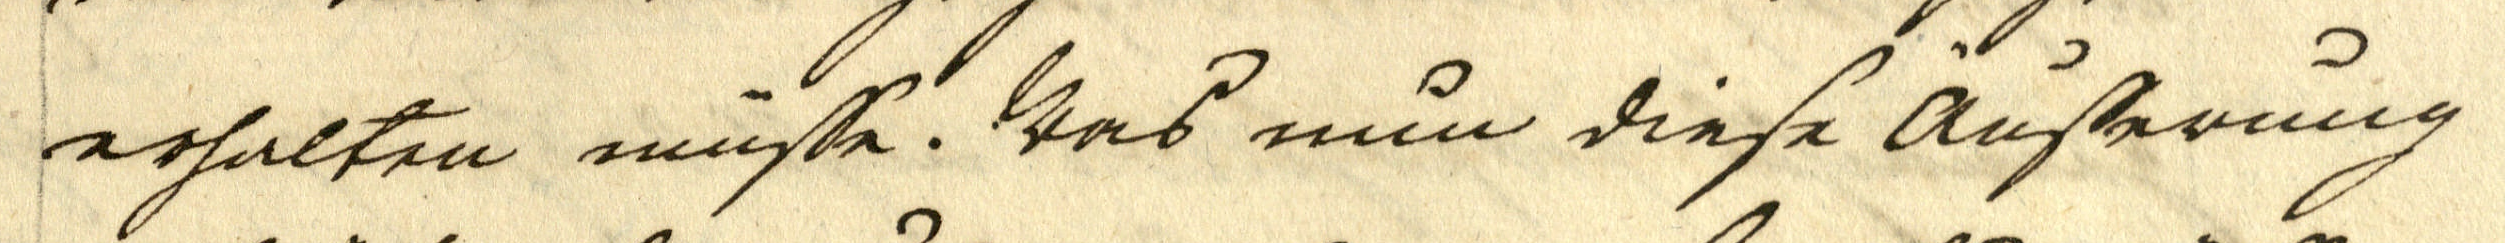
erhalten müsse. Was nun diese Äusserung
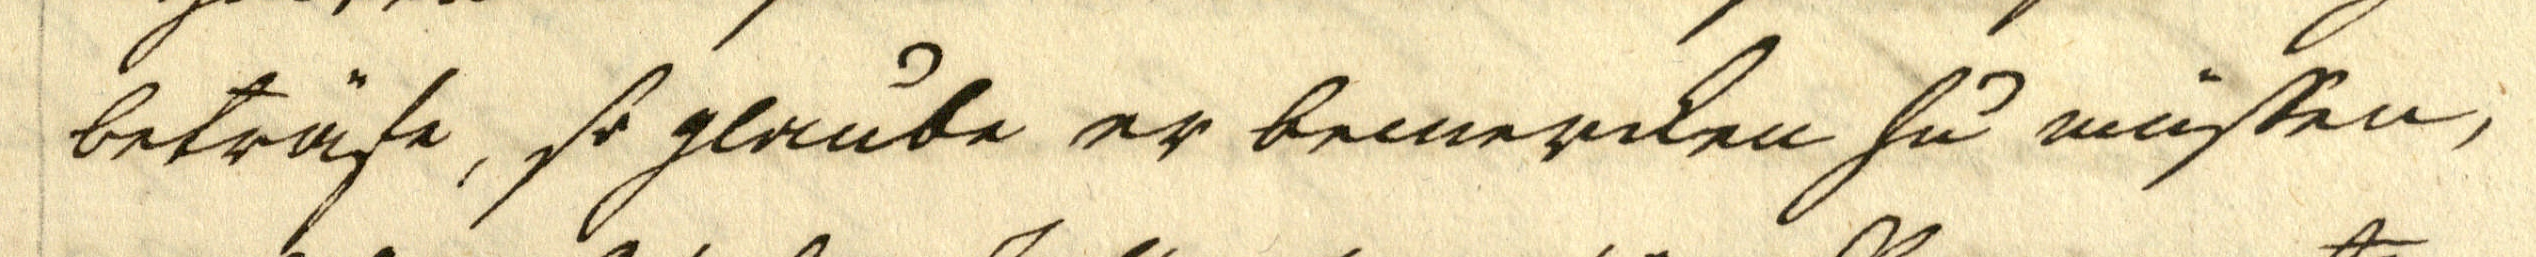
beträfe, so glaube er bemerken zu müssen,
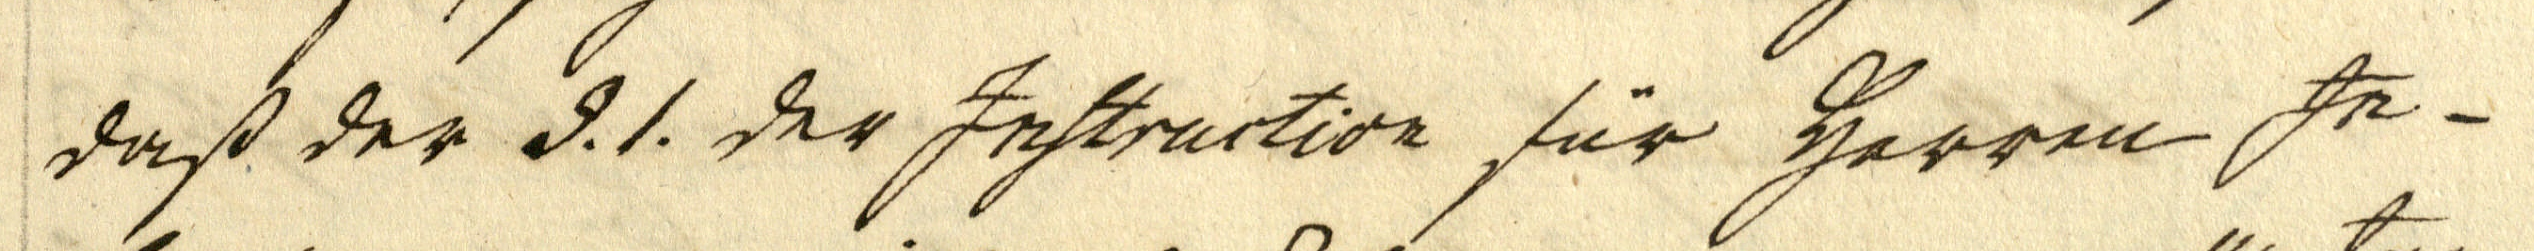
daß der §. 1. der Instruction für Herren In-
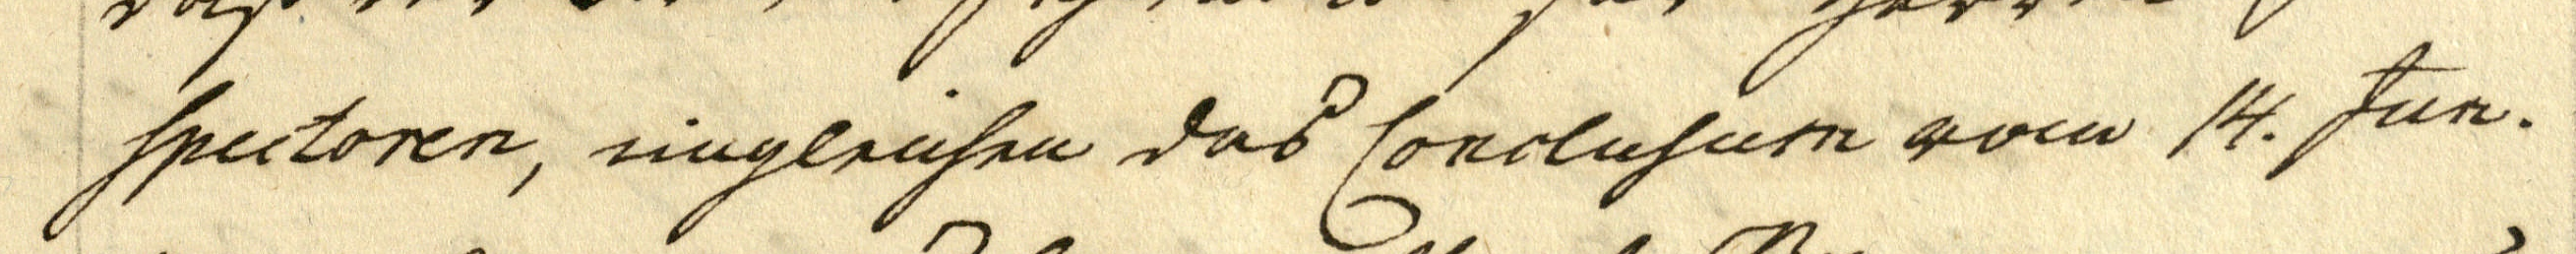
spectoren, imgleichen das Conclusum vom 14. Jun.
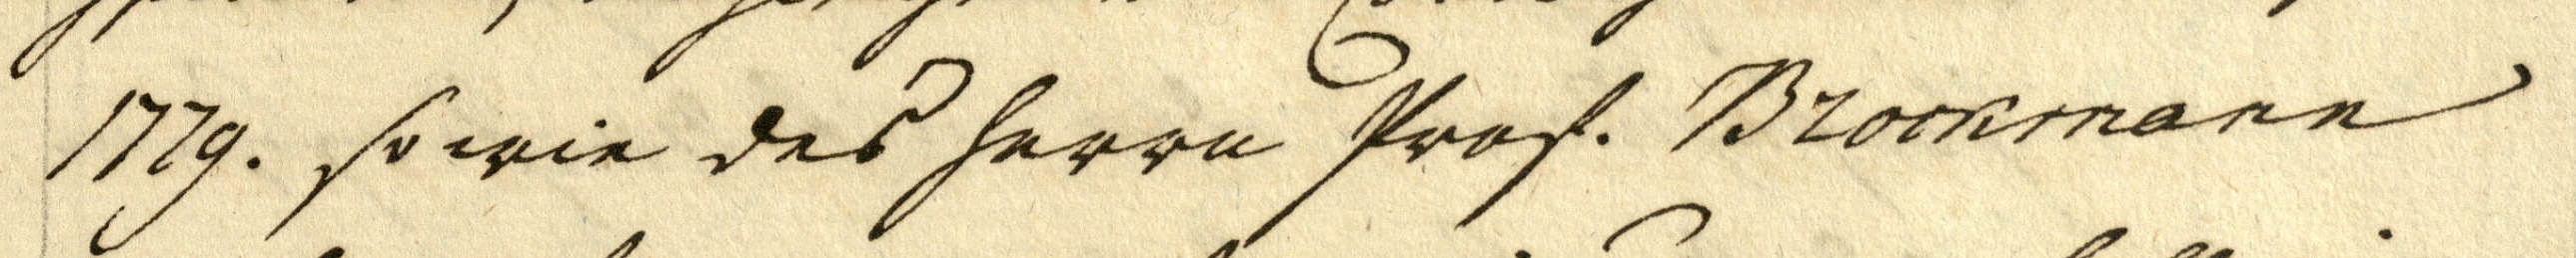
1779. so wie des herrn Prof. Brockmann
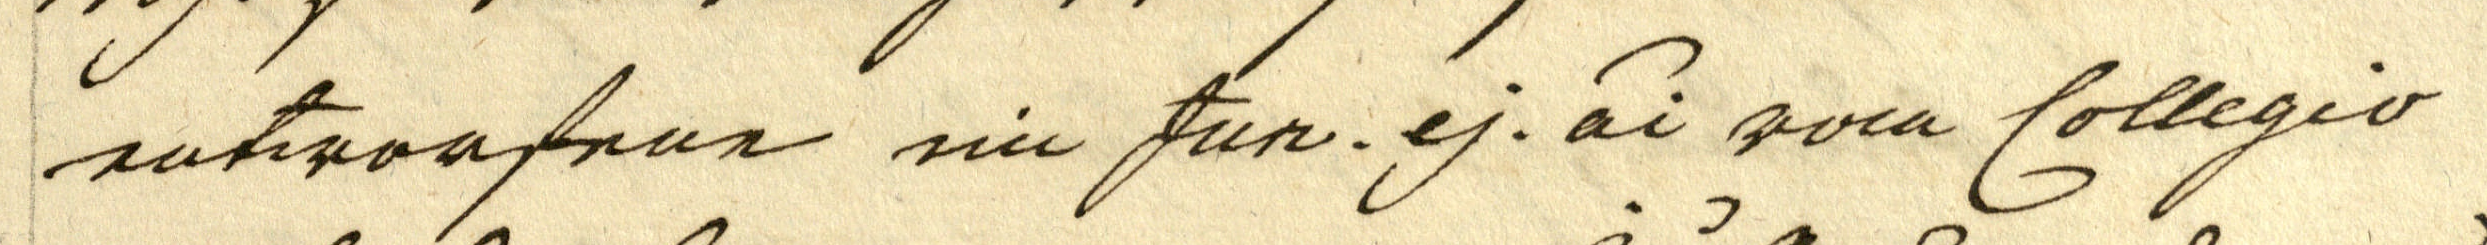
entworfene im Jun. ej. ai vom Collegio
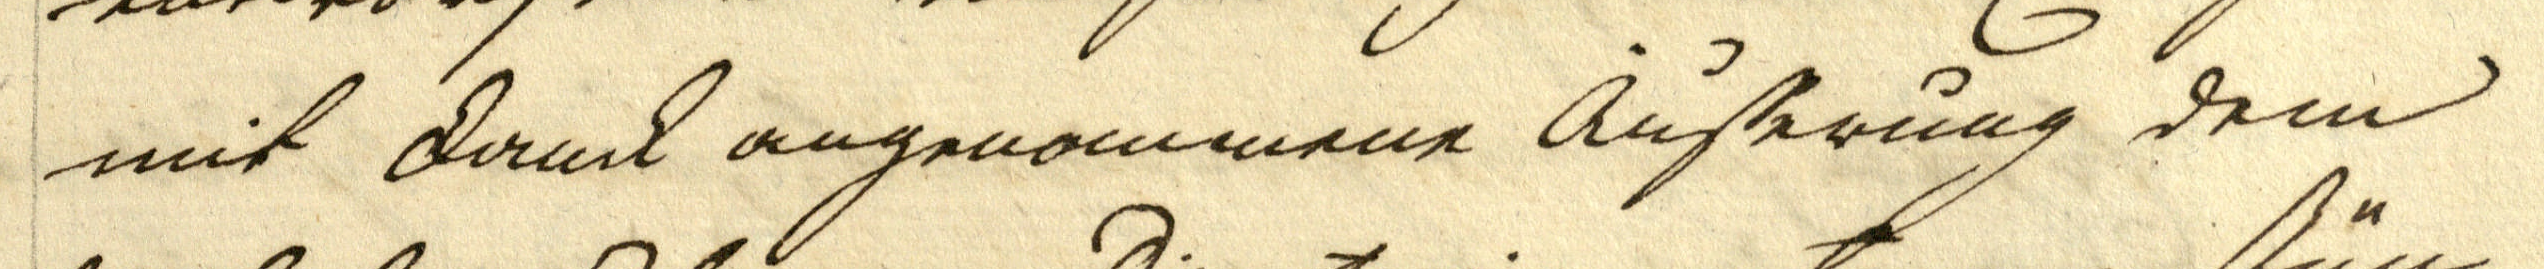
mit Dank angenommene Äusserung dem
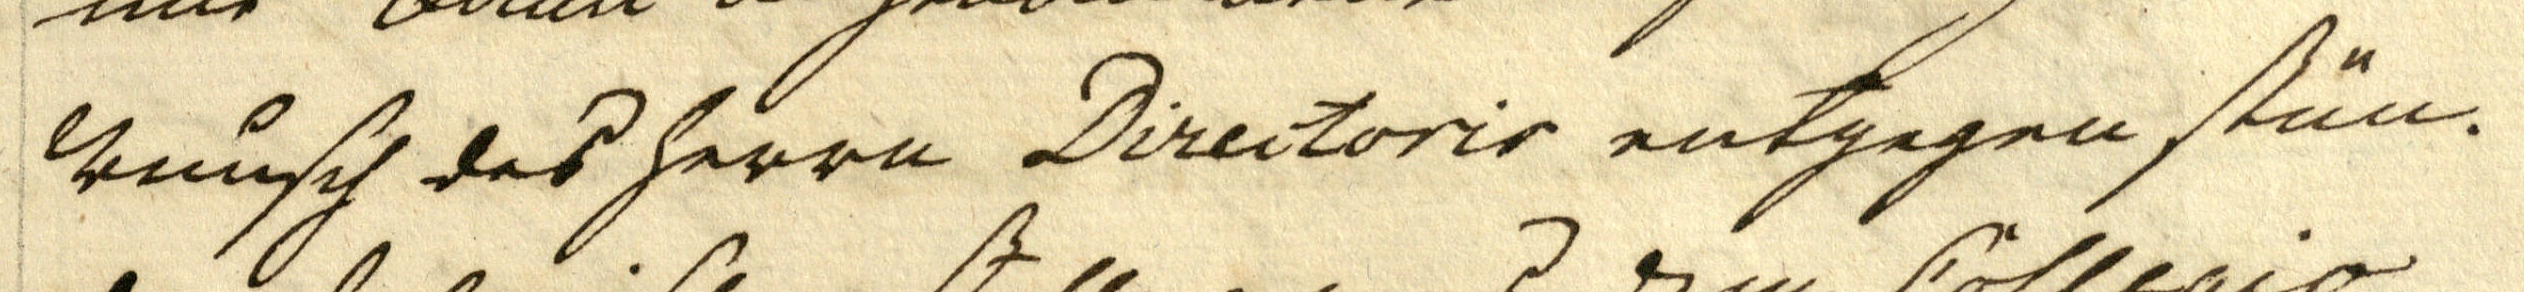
Wunsch des herrn Directoris entgegen stün-
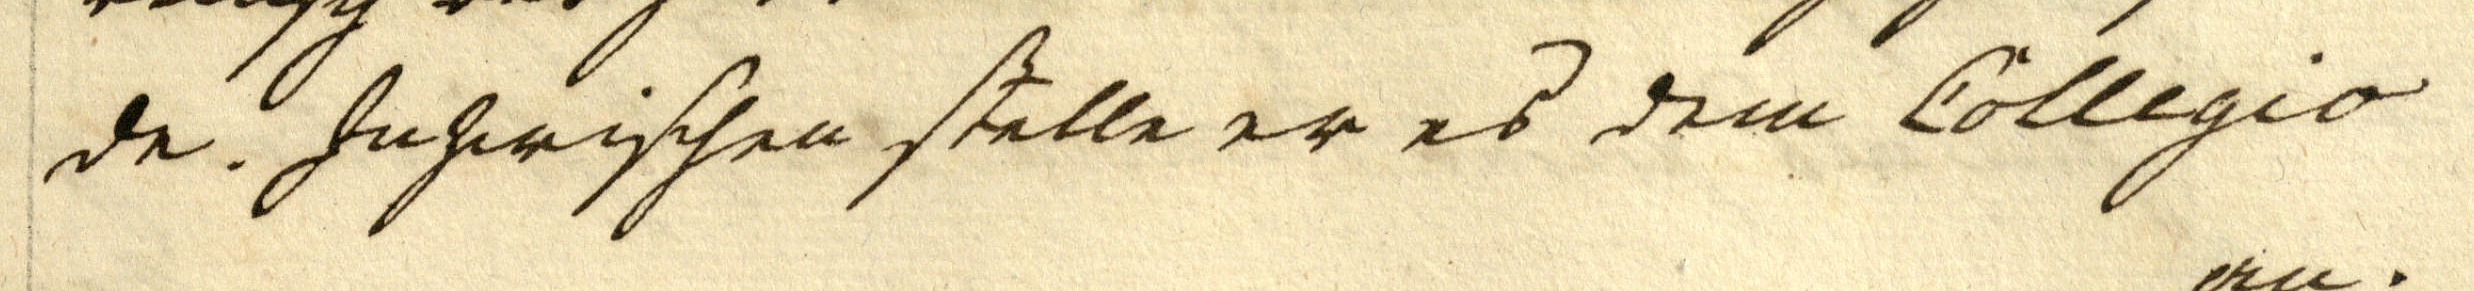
de. Inzwischen stelle er es dem Collegio
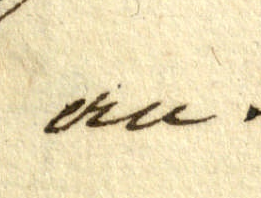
an-
